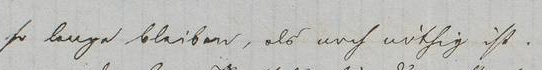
so lange bleiben, als noch nöthig ist.
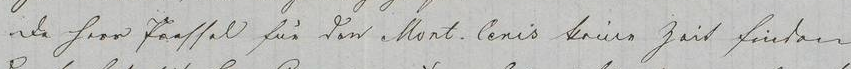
Da Herr Pressel für den Mont-Cenis keine Zeit finden
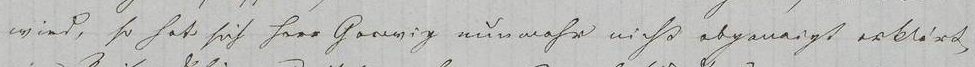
wird, so hat sich Herr Gerwig nunmehr nicht abgeneigt erklärt,
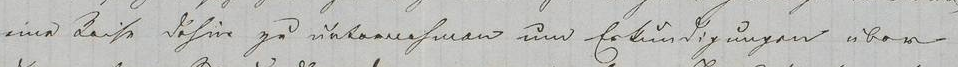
eine Reise dahin zu unternehmen um Erkundigungen über
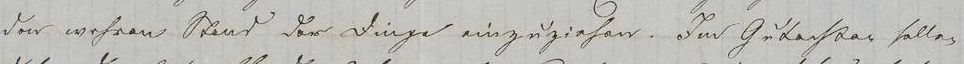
den wahren Stand der Dinge einzuziehen. Im Gutachten sollen
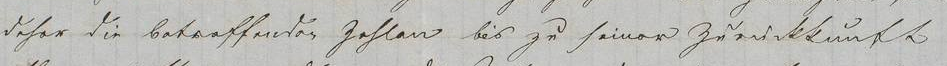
daher die betreffenden Zahlen bis zu seiner Zurückkunft
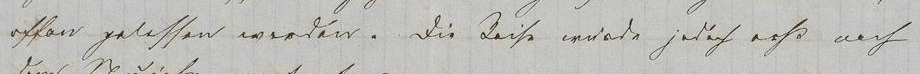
offen gelassen werden. Die Reise würde jedoch erst nach
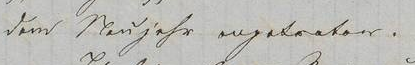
dem Neujahr angetreten.
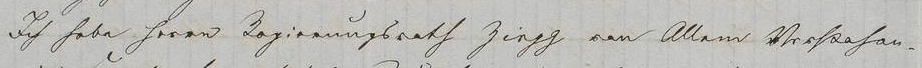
Ich habe Herrn Regierungsrath Zingg von Allem Vorstehen-
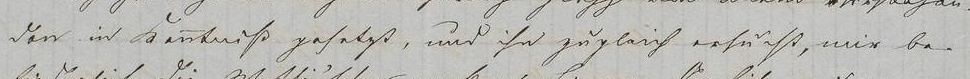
den in Kenntniß gesetzt, und ihn zugleich ersucht, mir be-
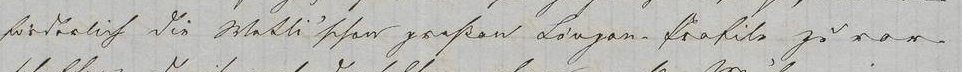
förderlich die Wetli'schen großen Längen-Profile zu ver-
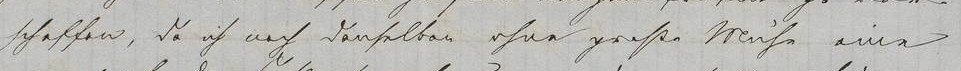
schaffen, da ich nach denselben ohne große Mühe eine
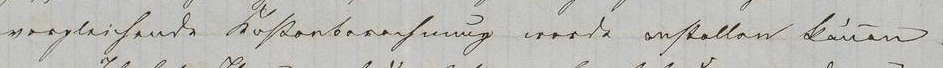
vergleichende Kostenberechnung werde erstellen können.
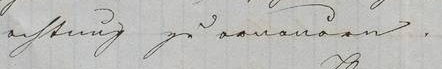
achtung zu erneuern.
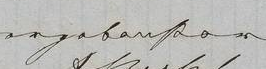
ergebenster
